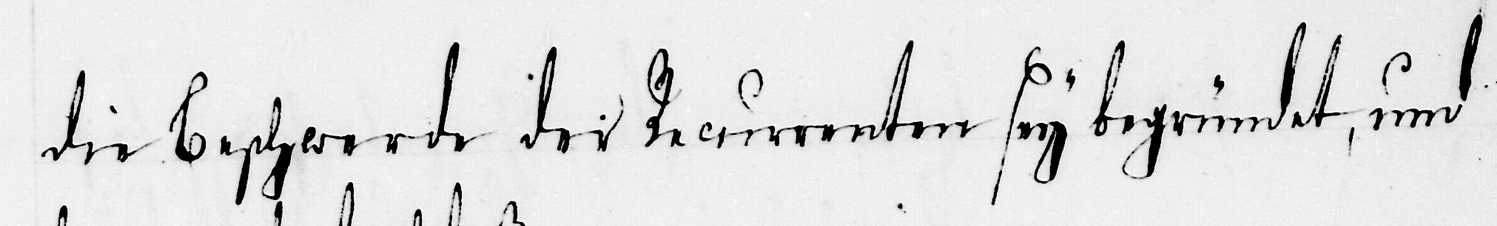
die Beschwerde der Recurrenten sey begründet, und
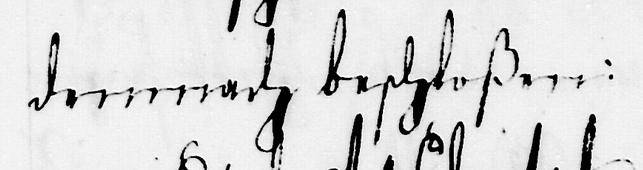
demnach beschloßen:
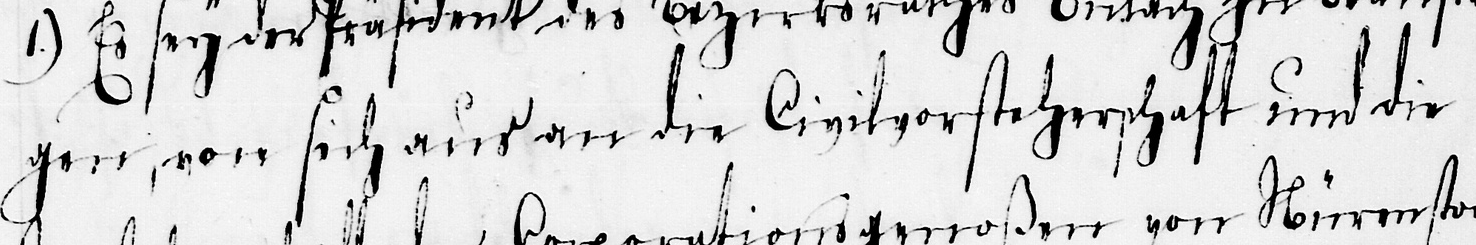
gen, von sich aus an die Civilvorsteherschaft und die
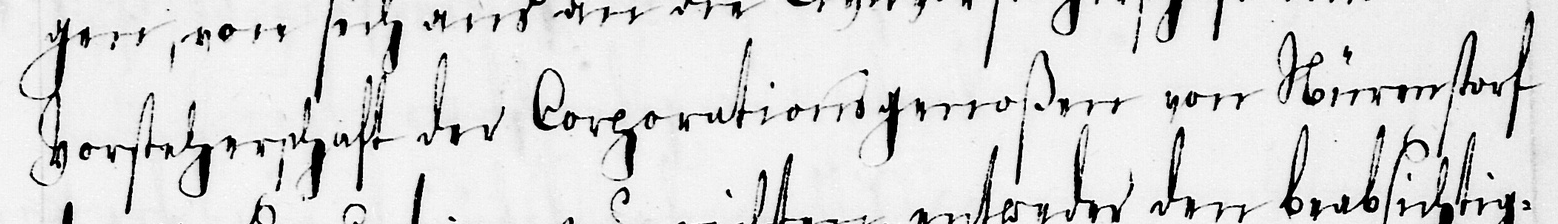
Vorsteherschaft der Corporationsgenoßen von Nürenstorf
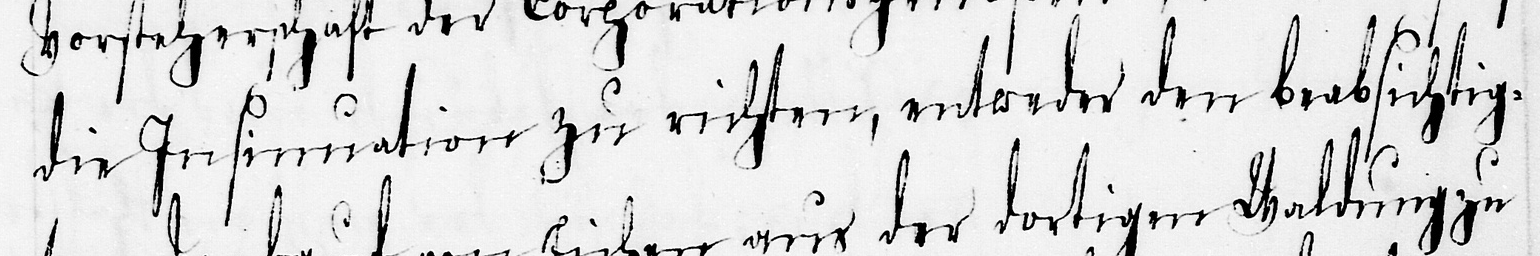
die Insinuation zu richten, entweder den beabsichtig¬
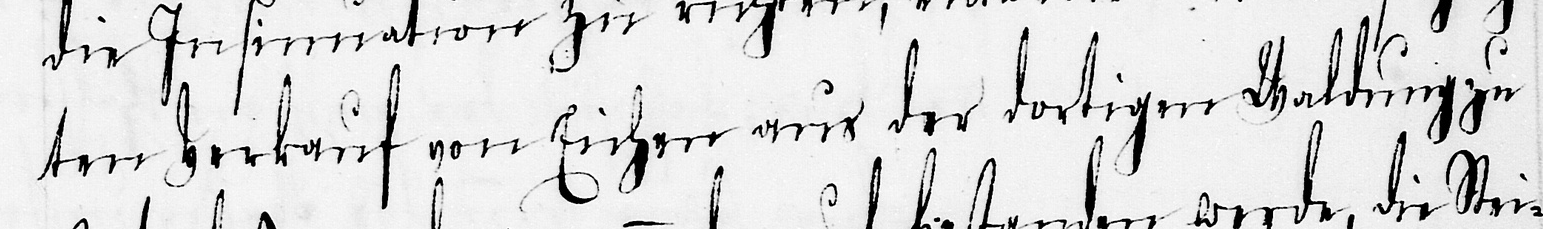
ten Verkauf von Eichen aus der dortigen Waldung zu
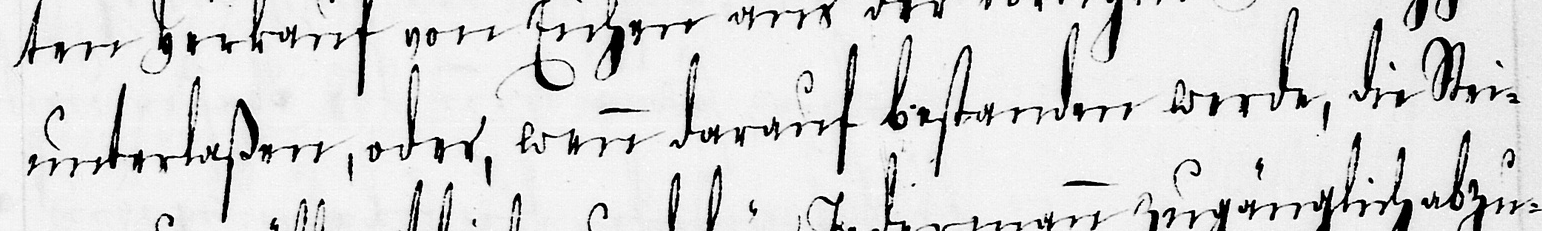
unterlaßen, oder, wenn darauf bestanden werde, die Stei¬
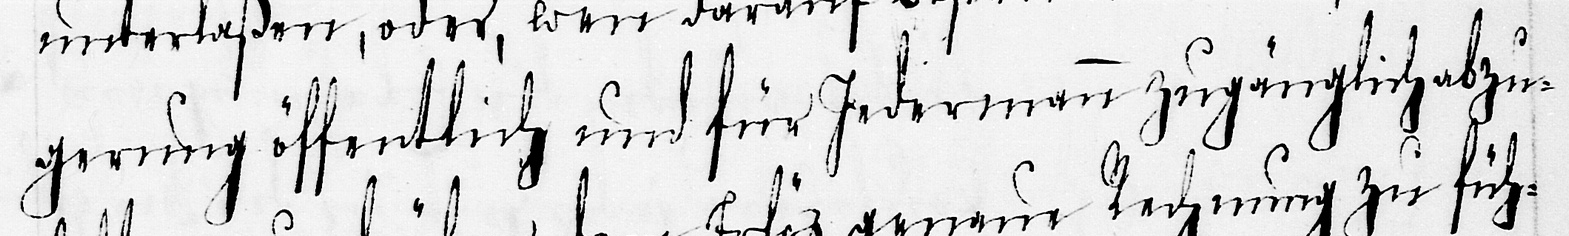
gerung öffentlich und für Jedermann zugänglich abzu¬
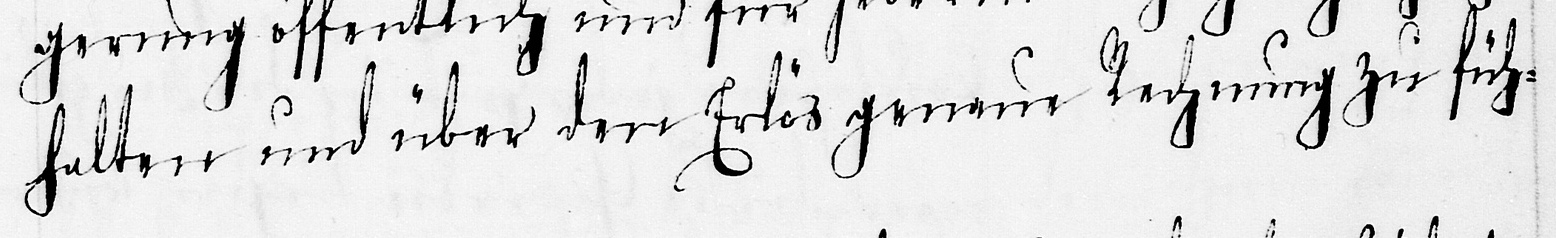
halten und über den Erlös genau Rechnung zu füh¬
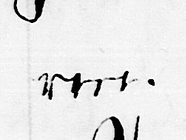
ren.
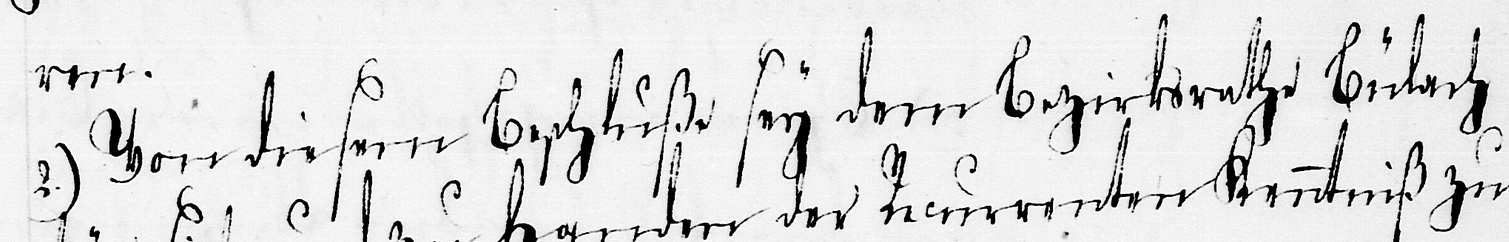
2.) Von diesem Beschluße sey dem Bezirksrathe Bülach
